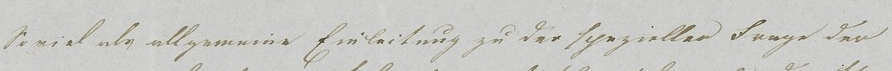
So viel als allgemeine Einleitung zu der speziellen Frage der
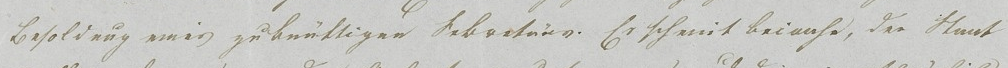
Besoldung eines zukünftigen Sekretärs. Es scheint beinahe, der Staat
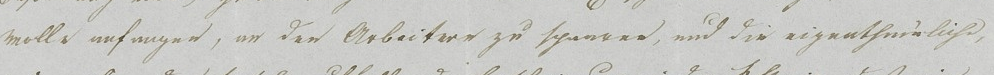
wolle anfangen, an den Arbeitern zu spaaren, und die eigenthümliche,
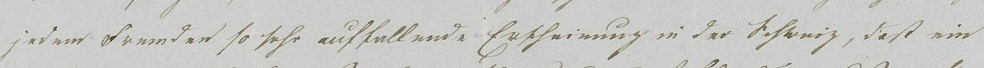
jedem Fremden so sehr auffallende Erscheinung in der Schweiz, daß ein
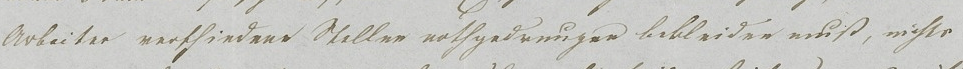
Arbeiter verschiedene Stellen nothgedrungen bekleiden muß, nichts
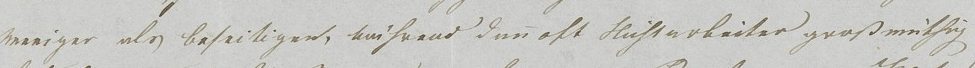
weniger als beseitigen, während dann oft Nichtarbeiter großmüthig
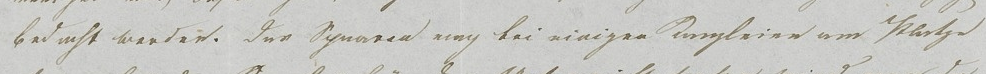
bedacht werden. Das Spaaren mag bei einigen Kanzleien am Platze
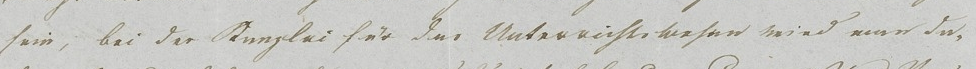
sein, bei der Kanzlei für das Unterrichtswesen wird man da-
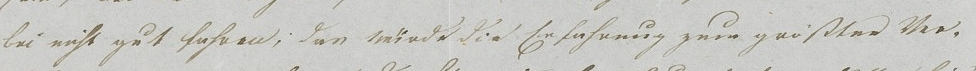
bei nicht gut fahren; das würde die Erfahrung zum größten Ver-
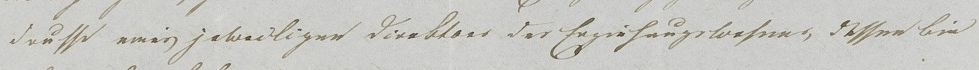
drusse eines jeweiligen Direktors des Erziehungswesens, dessen bin
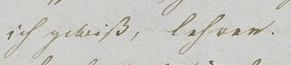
ich gewiß, lehren.
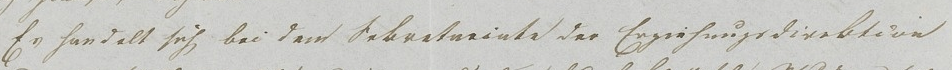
Es handelt sich bei dem Sekretariate der Erziehungsdirektion
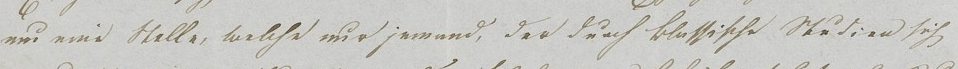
um eine Stelle, welche nur jemand, der durch klassische Studien sich
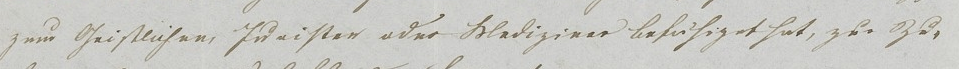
zum Geistlichen, Juristen oder Mediziner befähiget hat, zur Zu-
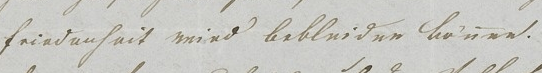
friedenheit wird bekleiden können.
